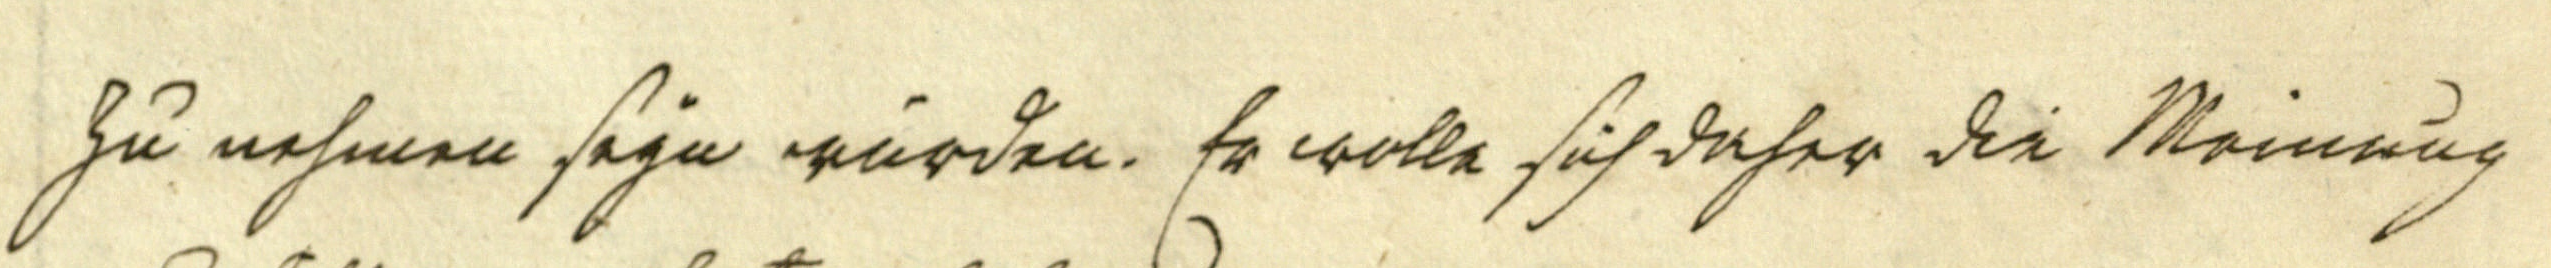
zu nehmen seÿn würden. Er wolle sich daher die Meinung
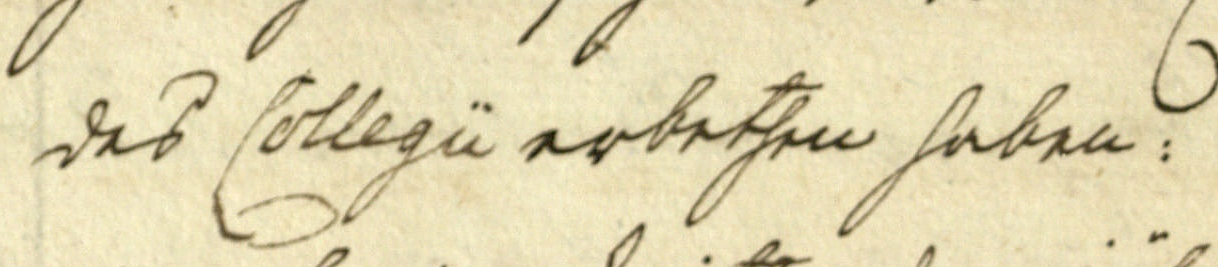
des Collegii erbethen haben:
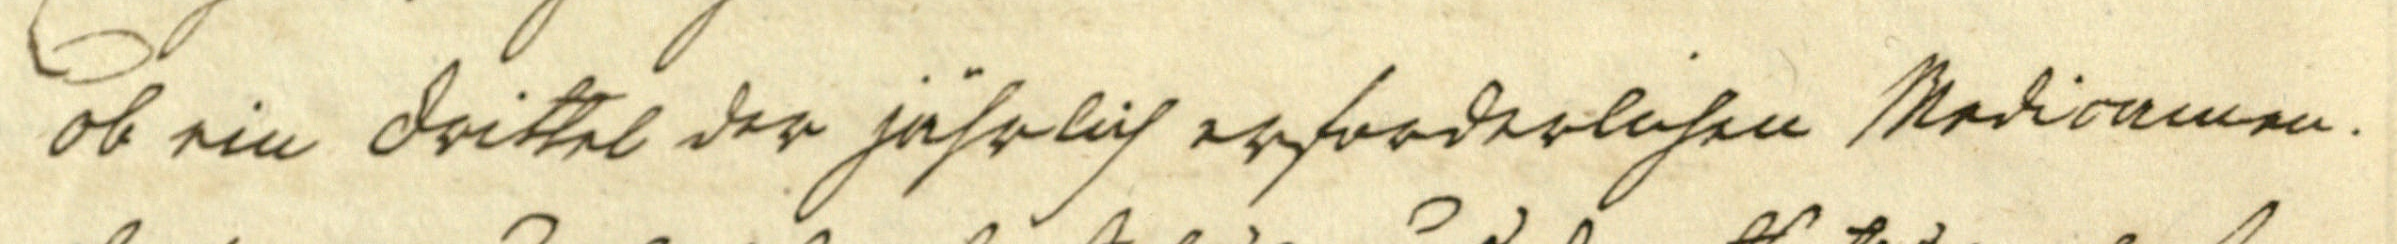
ob ein Drittel der jährlich erforderlichen Medicamen¬
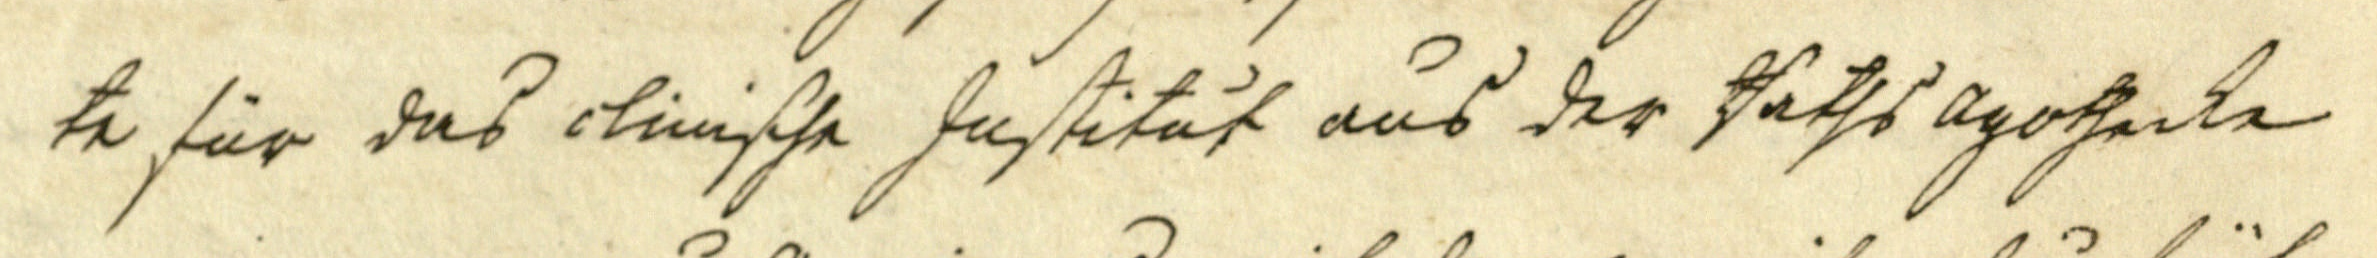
te für das clinische Institut aus der Raths Apothecke
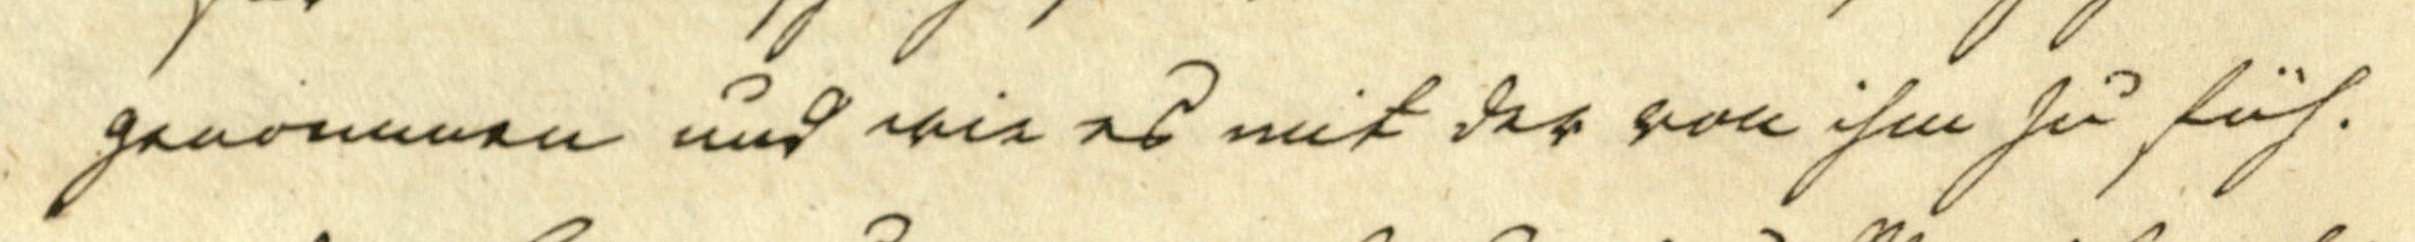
genommen und wie es mit der von ihm zu füh¬
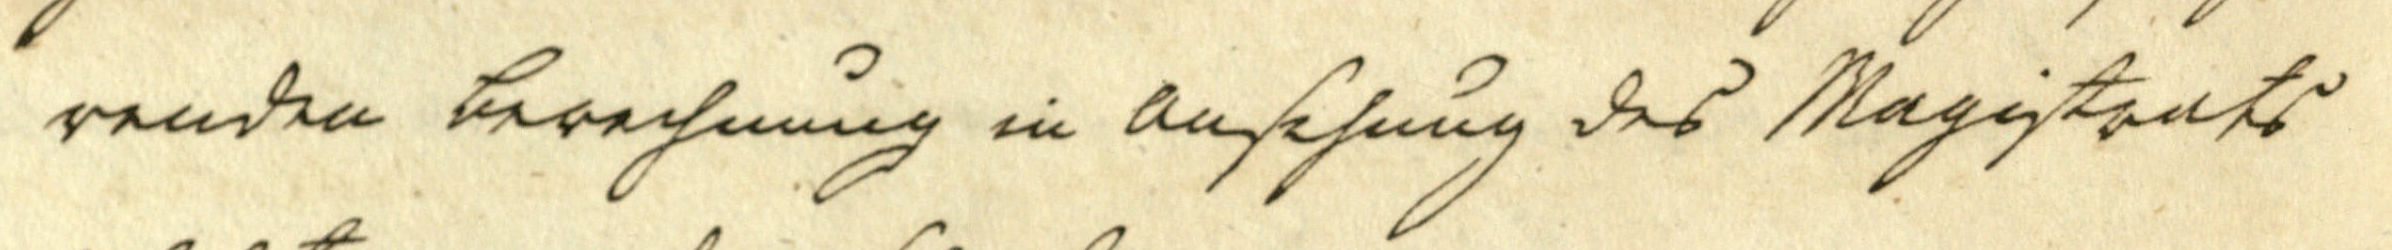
renden Berechnung in Ansehung des Magistrats
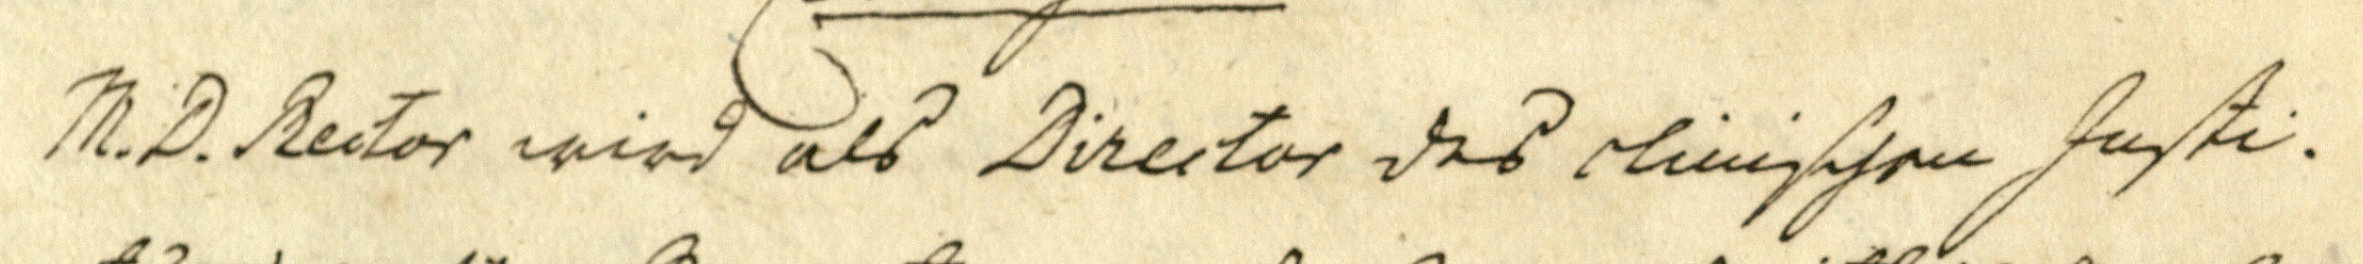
M. D. Rector wird als Director des clinischen Insti¬
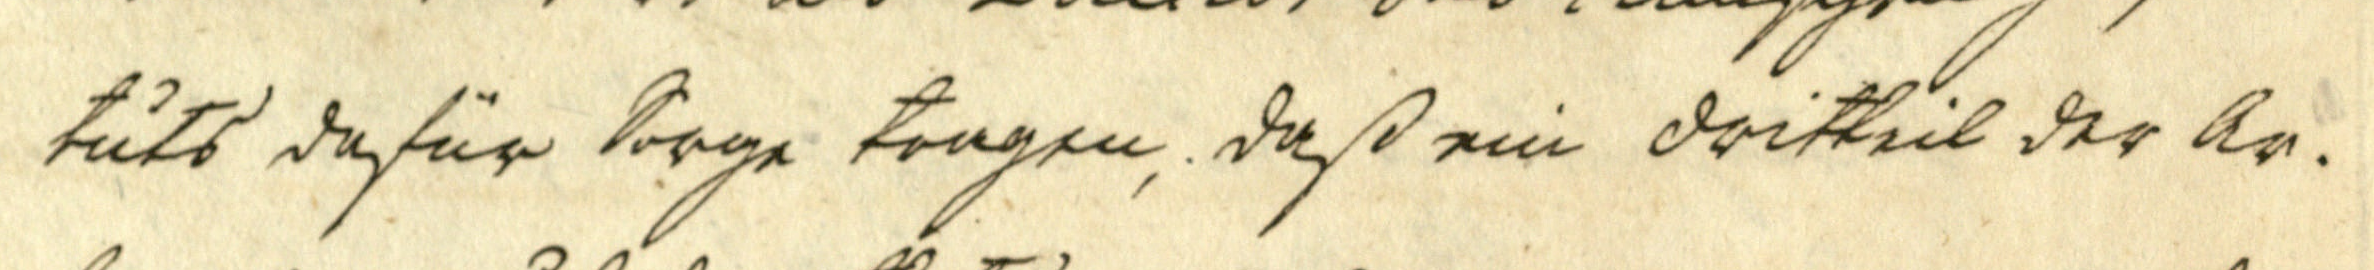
tuts dafür Sorge tragen, daß ein dritteil der Ar¬
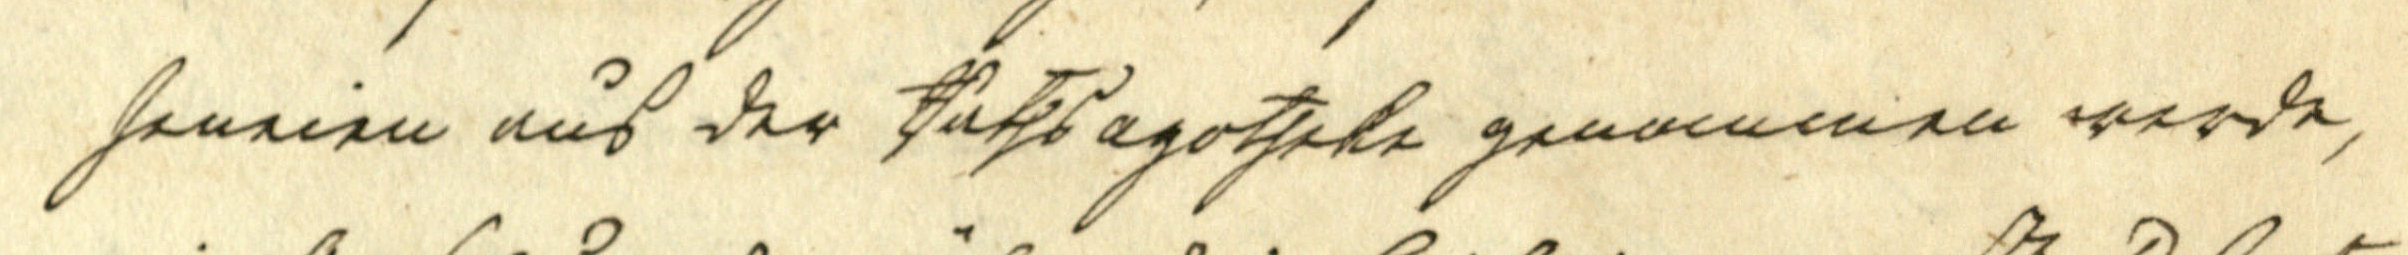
zeneien aus der Rathsapotheke genommen werde,
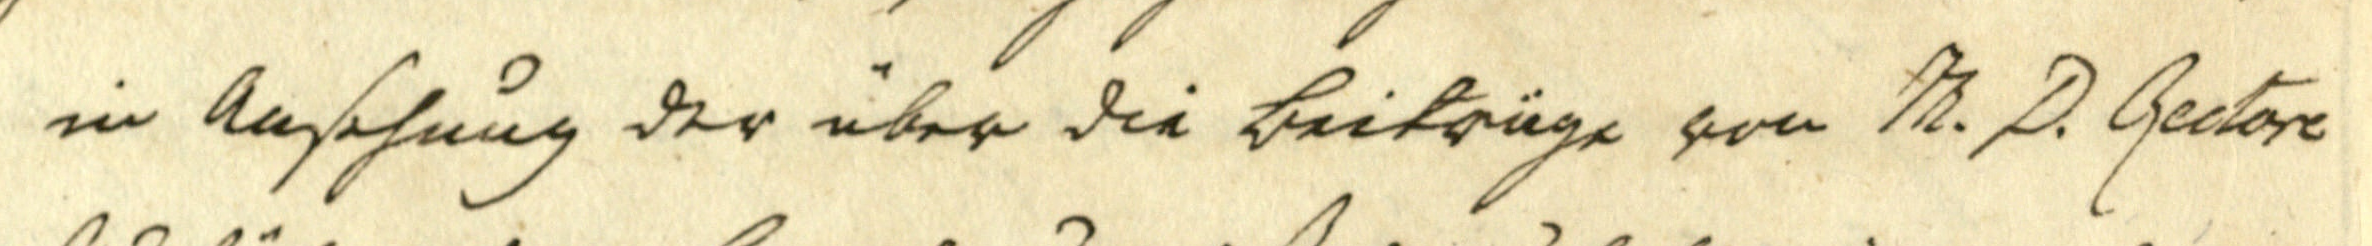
in Ansehung der über die Beiträge von M. D. Rectore
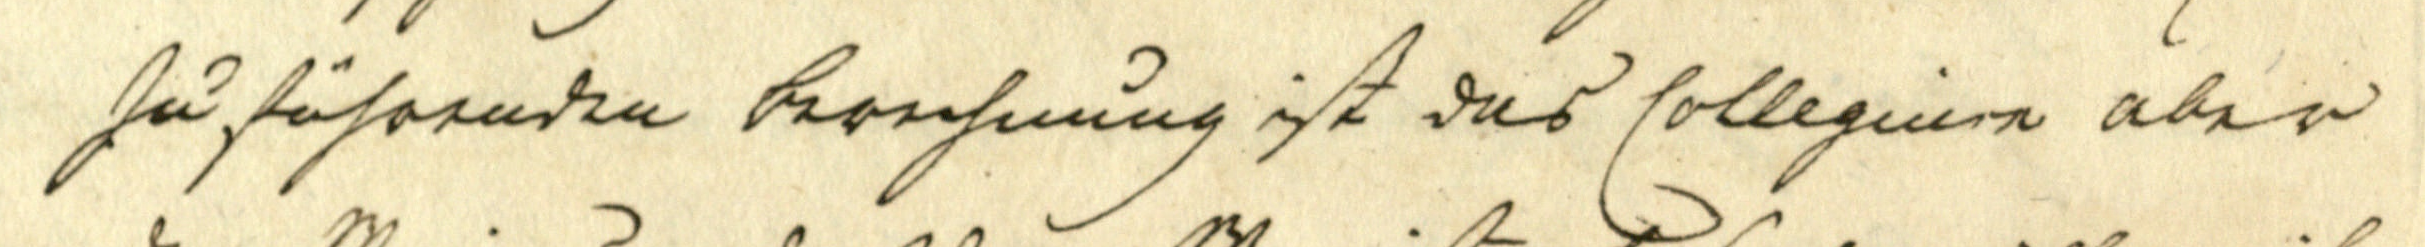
zu führenden Berechnung ist das Collegium aber
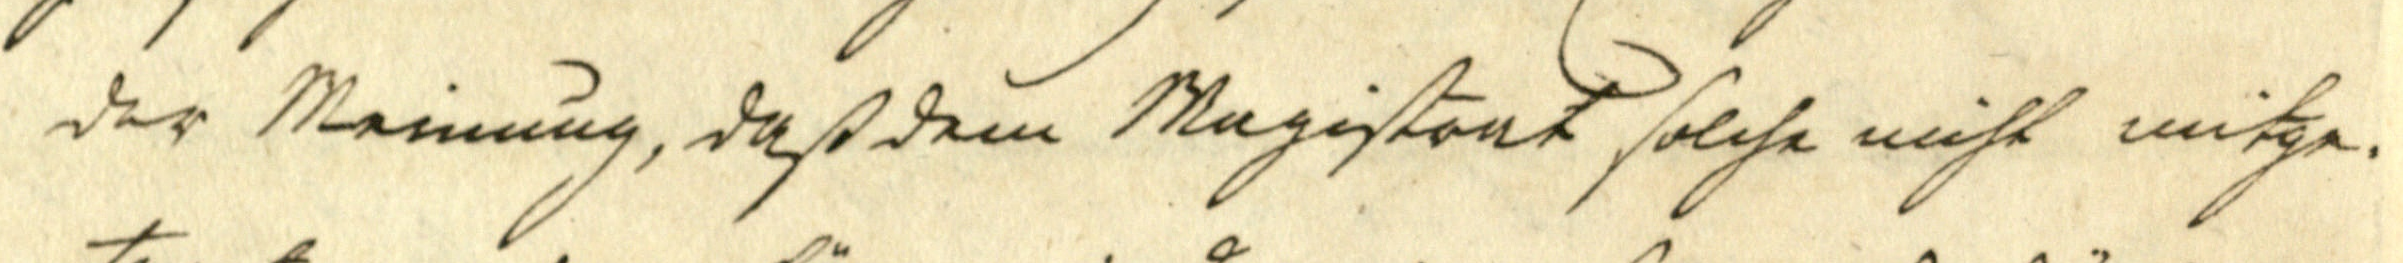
der Meinung, daß dem Magistrat solche nicht mitge¬
